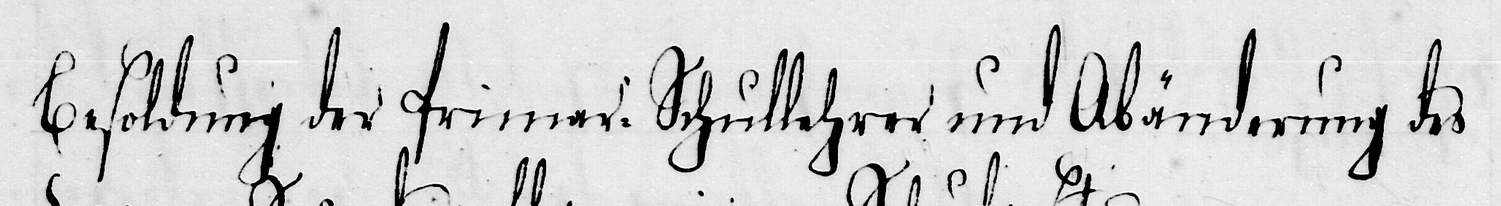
Besoldung der Primar-Schullehrer und Abänderung des
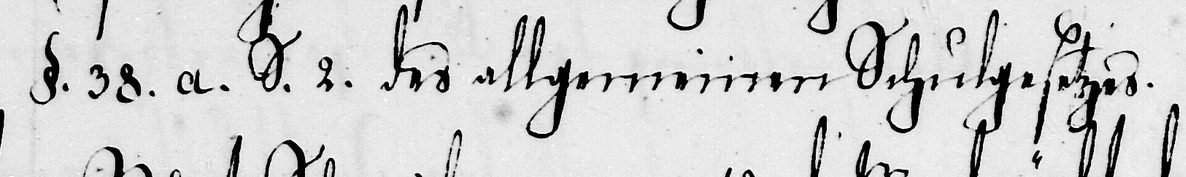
§. 38. a. S. 2. des allgemeinen Schulgesetzes.
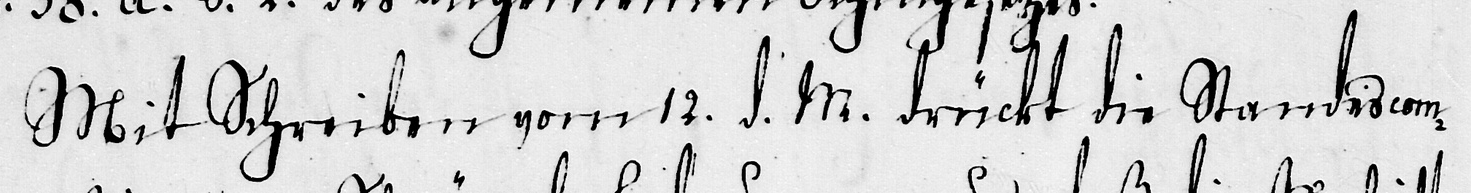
Mit Schreiben vom 12. d. M. drückt die Standescom¬
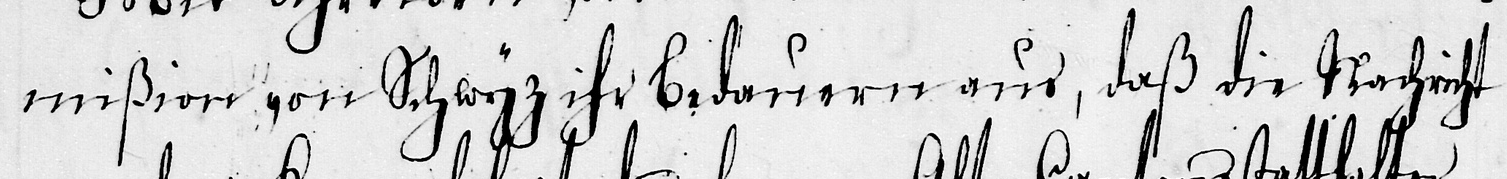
mißion von Schwyz ihr Bedauern aus, daß die Nachricht
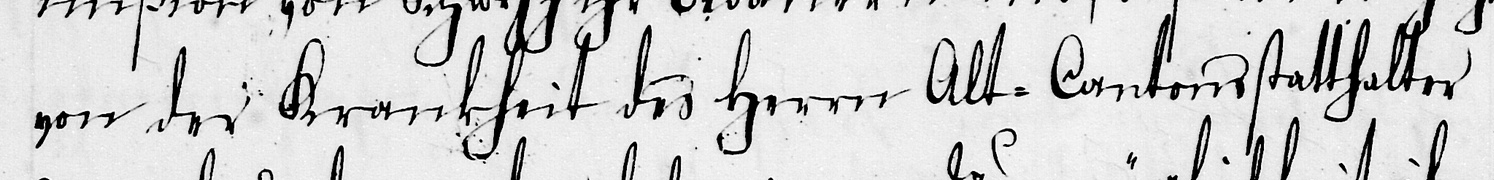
von der Krankheit des Herrn Alt-Cantonsstatthalter
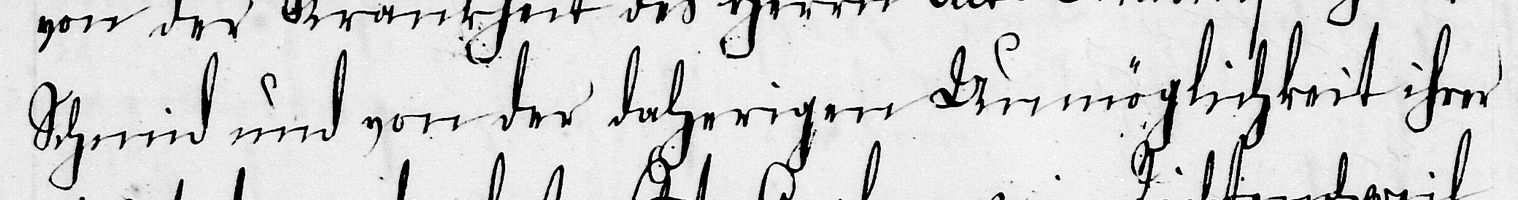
Schmid und von der daherigen Unmöglichkeit ihrer
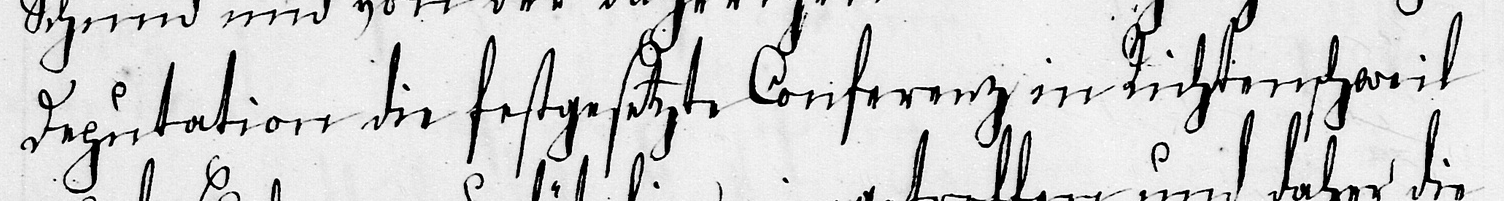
Deputation die festgesetzte Conferenz in Richterschweil
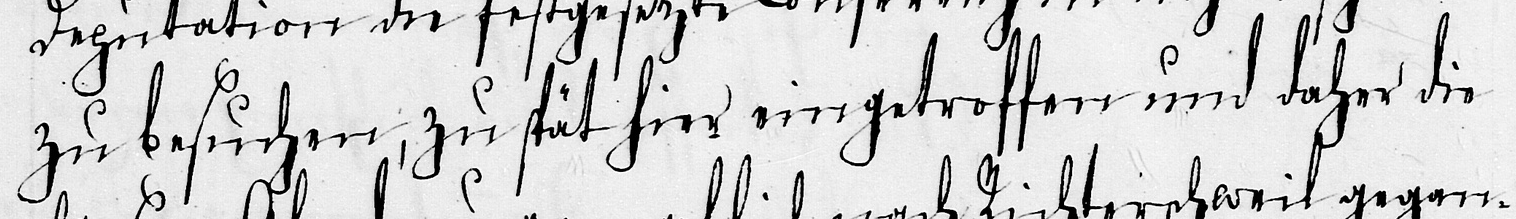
zu besuchen, zu spät hier eingetroffen und daher die
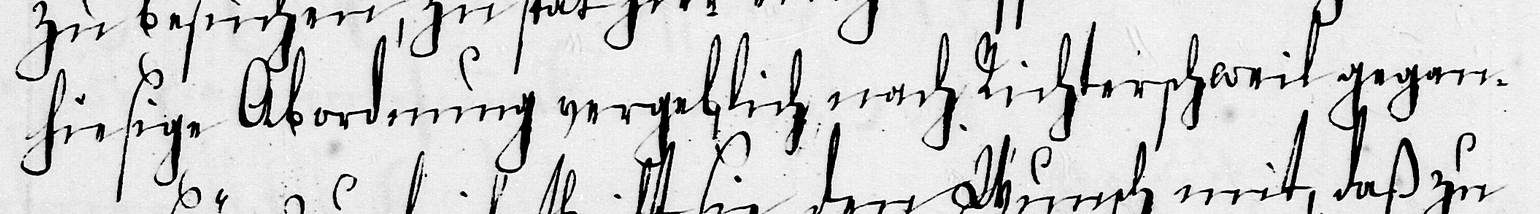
hiesige Abordnung vergeblich nach Richterschweil gegan¬
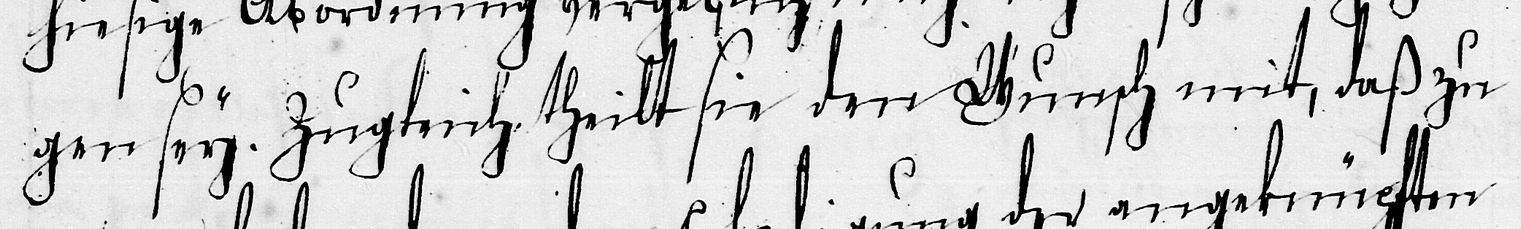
gen sey. Zugleich theilt sie den Wunsch mit, daß zu
